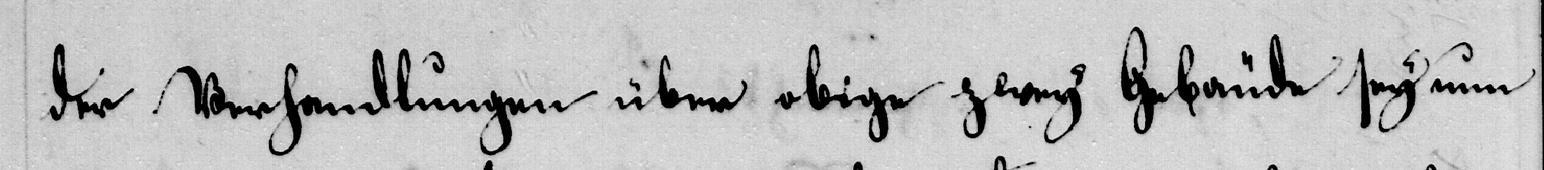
der Verhandlungen über obige zwey Gebäude sey nun
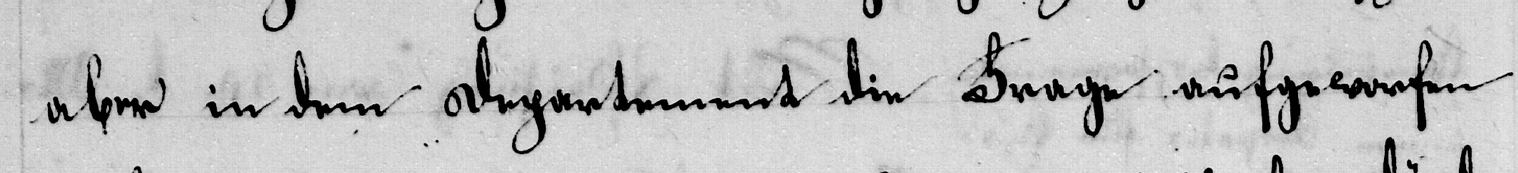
aber in dem Departement die Frage aufgeworfen
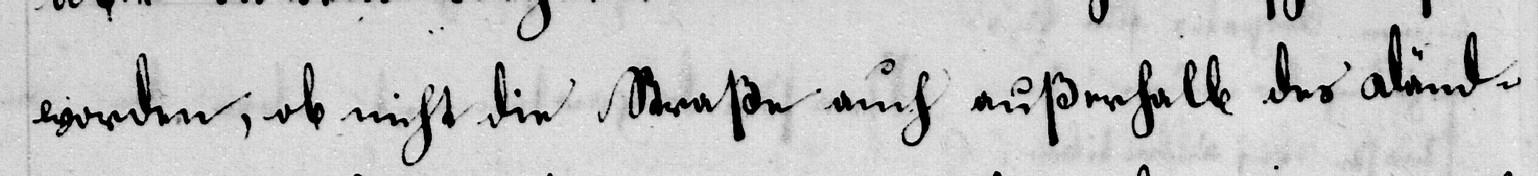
worden, ob nicht die Straße auch außerhalb des Dänd¬
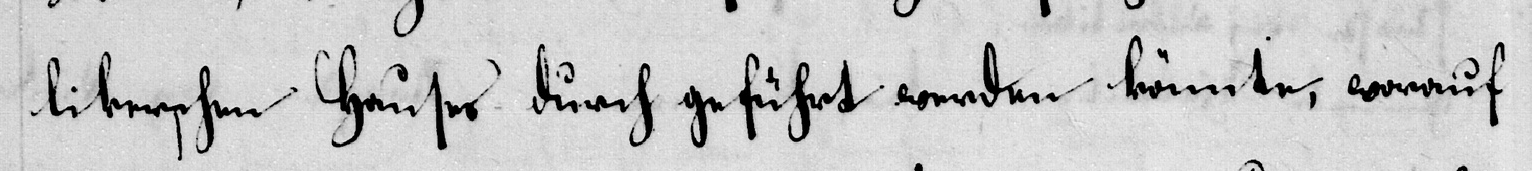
likerschen Hauses durch geführt werden könnte, worauf
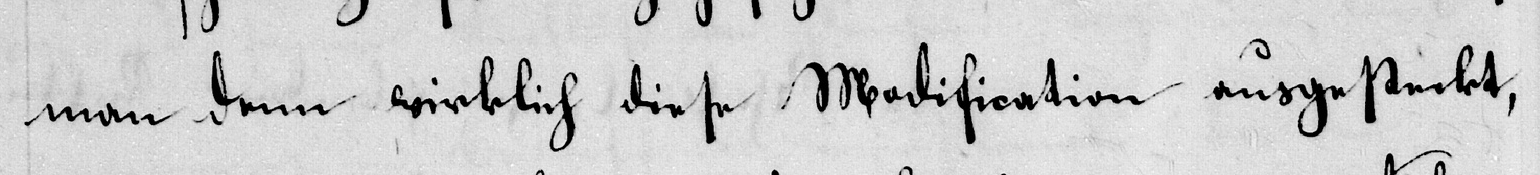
man denn wirklich diese Modification ausgesteckt,
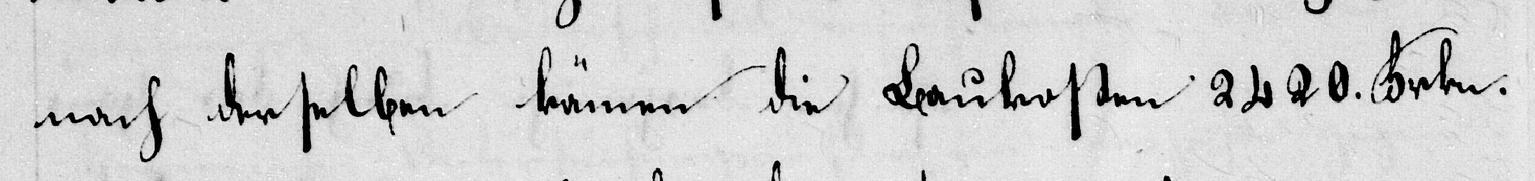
nach derselben kämen die Baukosten 2420. Frkn.
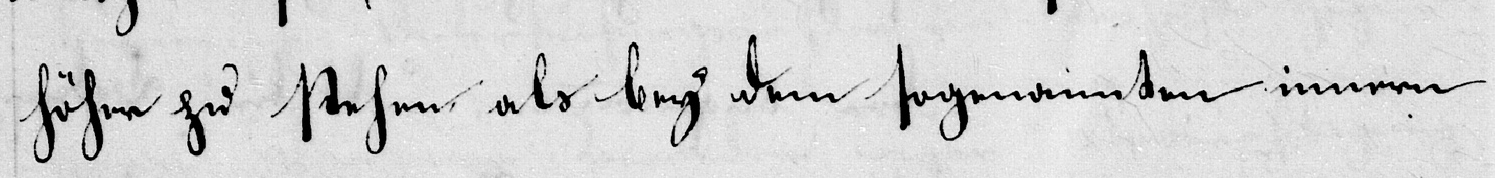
höher zu stehen als bey dem sogenannten innern
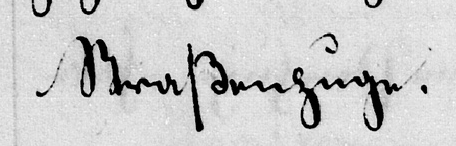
Straßenzuge.
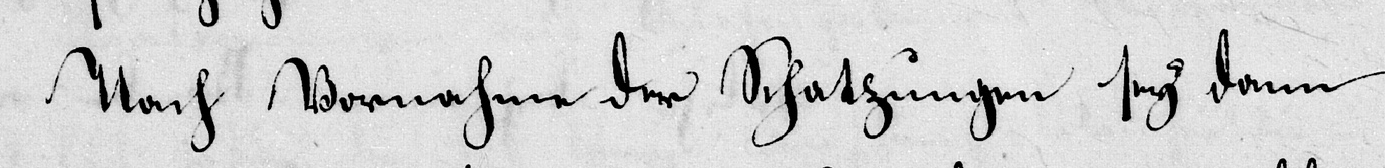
Nach Vornahme der Schatzungen sey dann
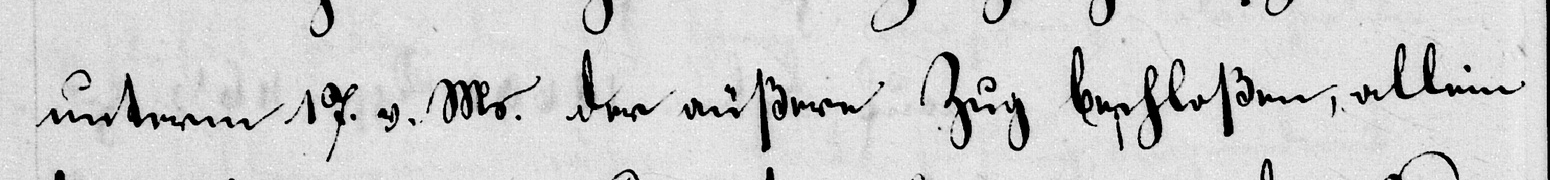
unterm 17. v. Ms. der äußere Zug beschloßen, allein
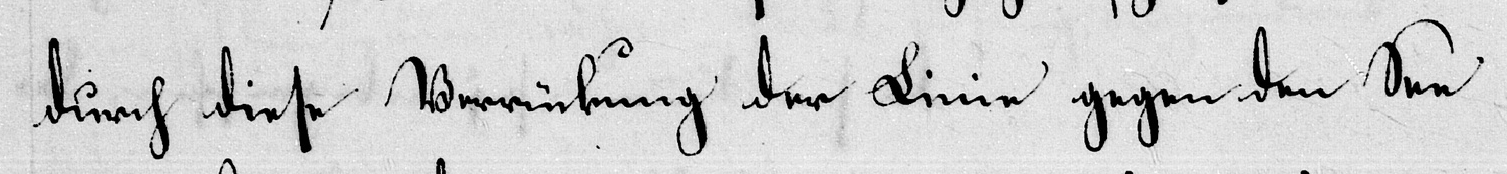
durch diese Verrückung der Linie gegen den See
